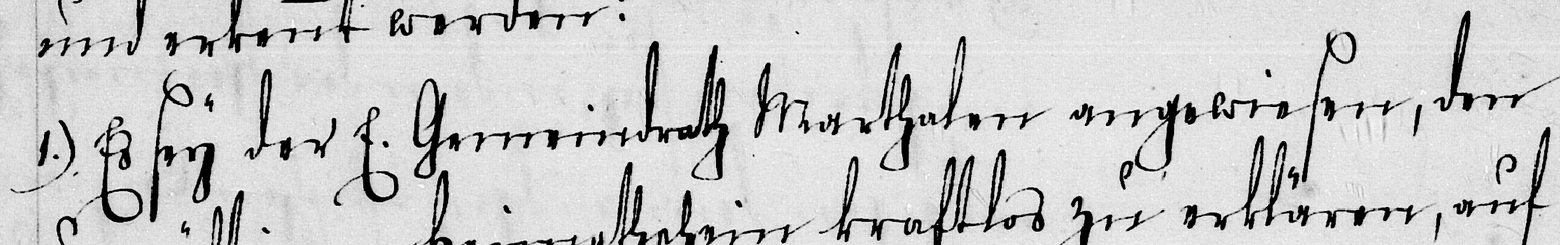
1.) Es sey der E. Gemeindrath Marthalen angewiesen, den
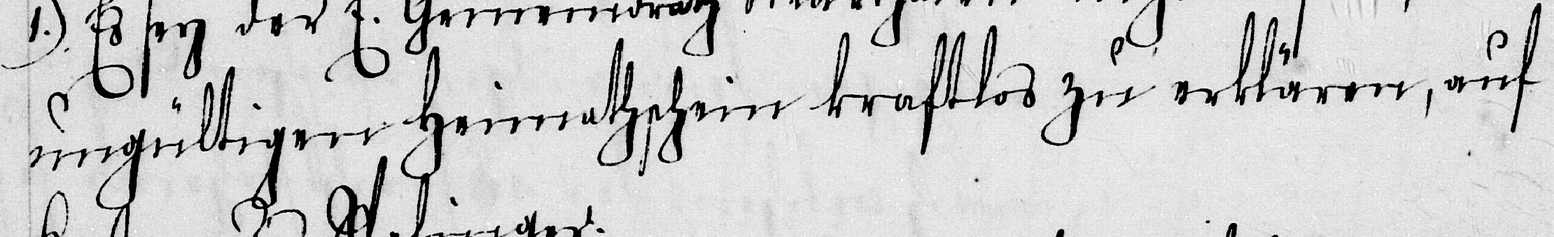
ungültigen Heimathschein kraftlos zu erklären, auf
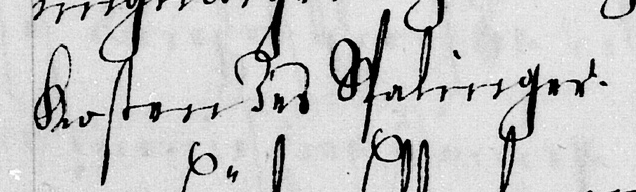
Kosten des Spalinger.
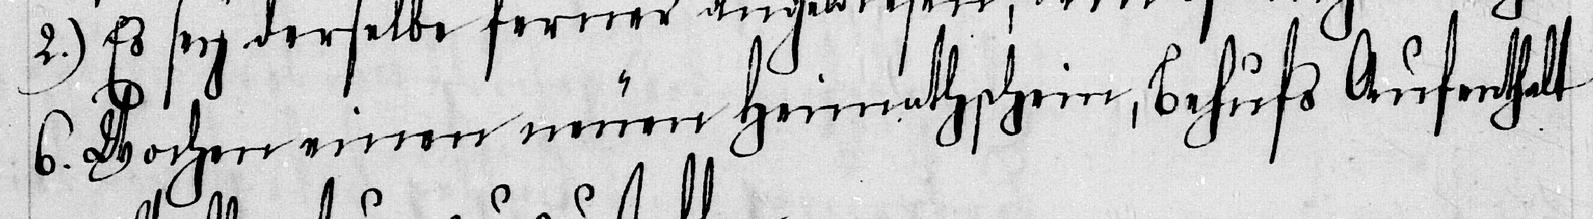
6. Wochen einen neuen Heimathschein, Behufs Aufenthalt
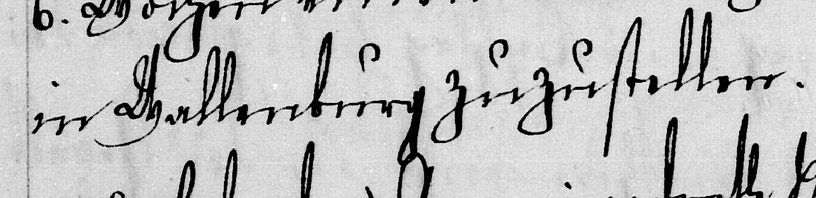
in Wallenburg zuzustellen.
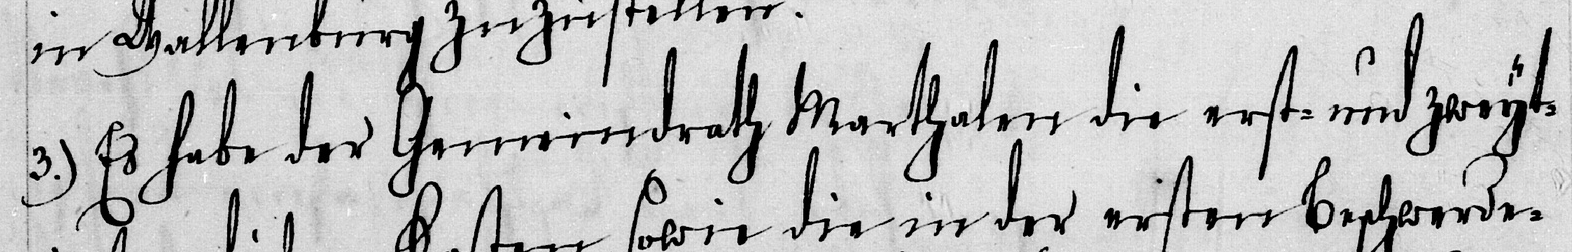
3.) Es habe der Gemeindrath Marthalen die erst- und zweyt¬
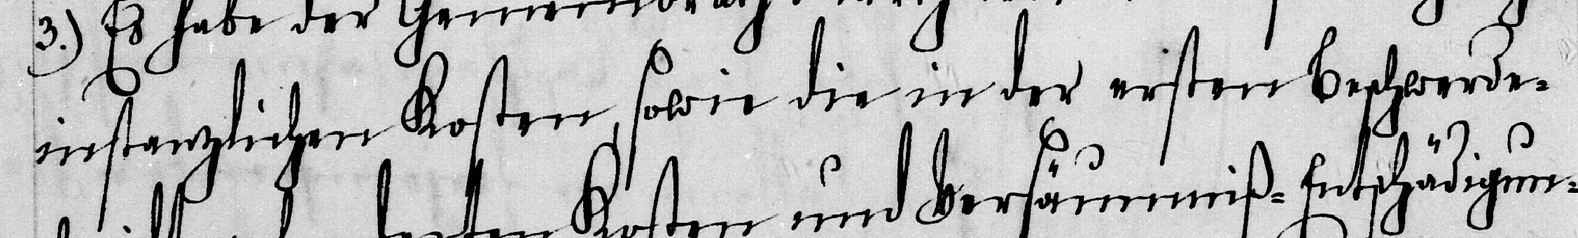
instanzlichen Kosten, sowie die in der ersten Beschwerde¬
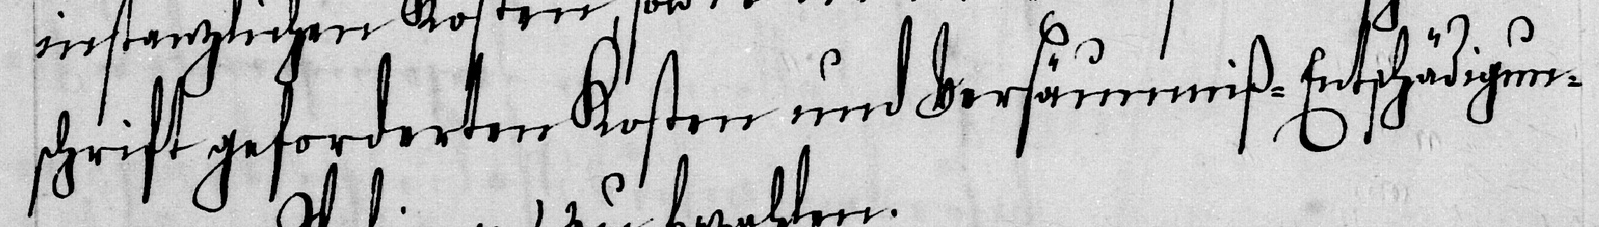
schrift geforderten Kosten und Versäumniß-Entschädigun¬
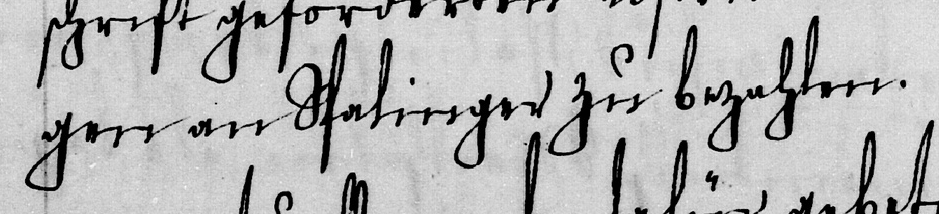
gen an Spalinger zu bezahlen.
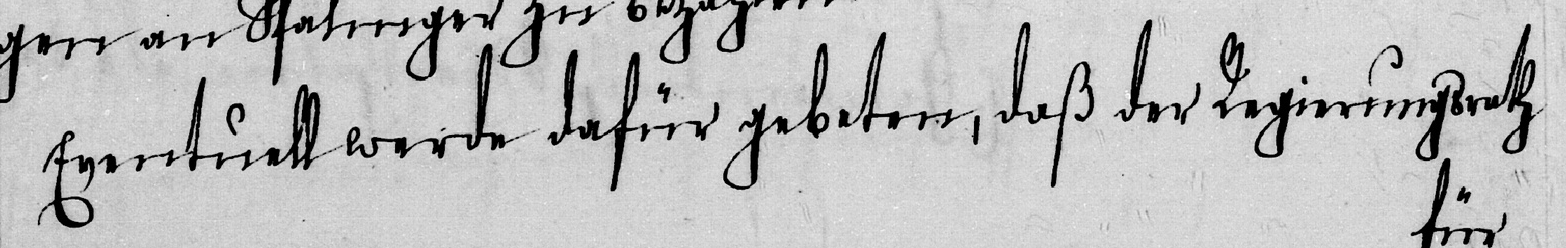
Eventuell werde dafür gebeten, daß der Regierungsrath
